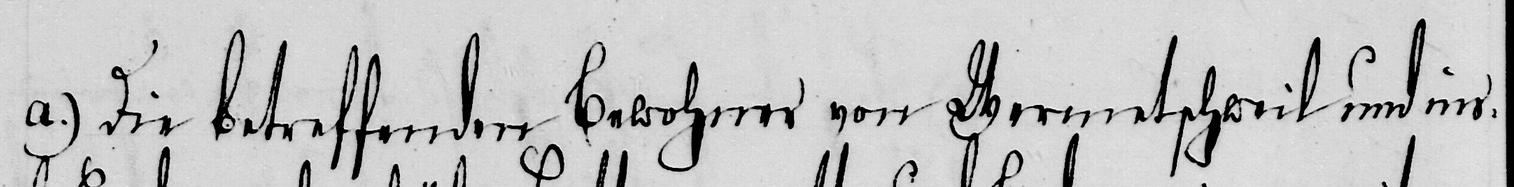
a.) Die betreffenden Bewohner von Wermetschweil und in¬
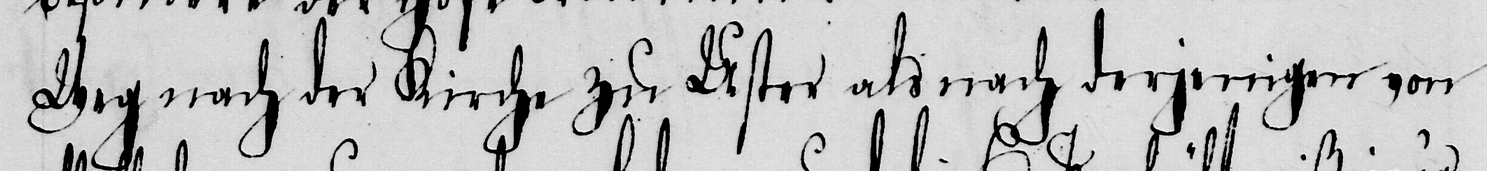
Weg nach der Kirche zu Uster als nach derjenigen von
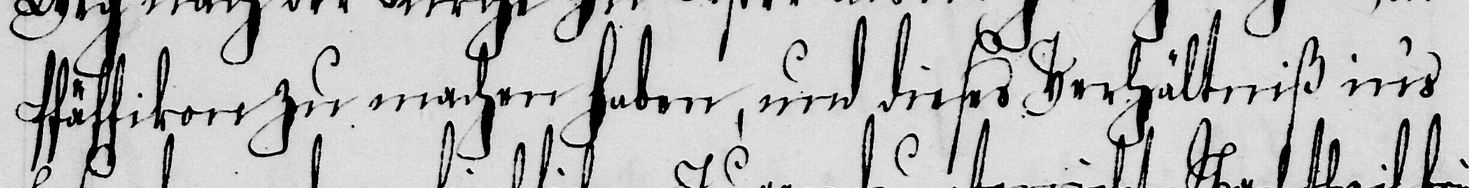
Pfäffikon zu machen haben, und dieses Verhältniß ins
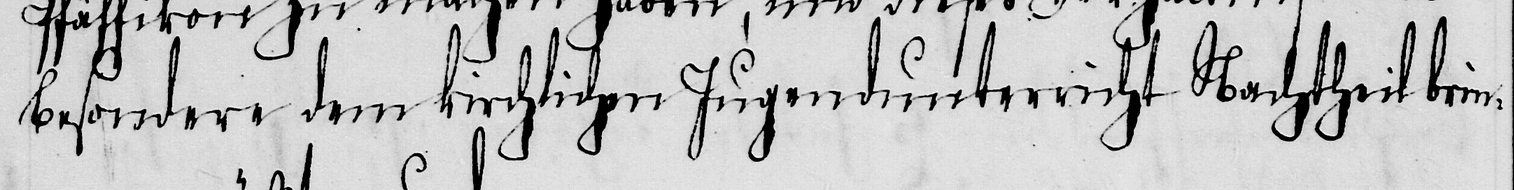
besondere dem kirchlichen Jugendunterricht Nachtheil bri¬
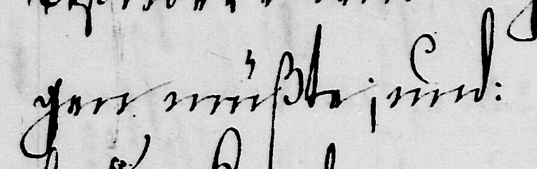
ngen müßte; und:
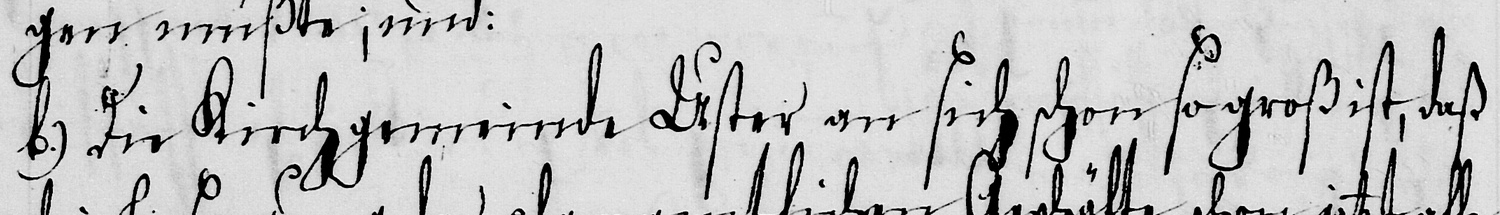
b.) Die Kirchgemeinde Uster an sich schon groß ist, daß
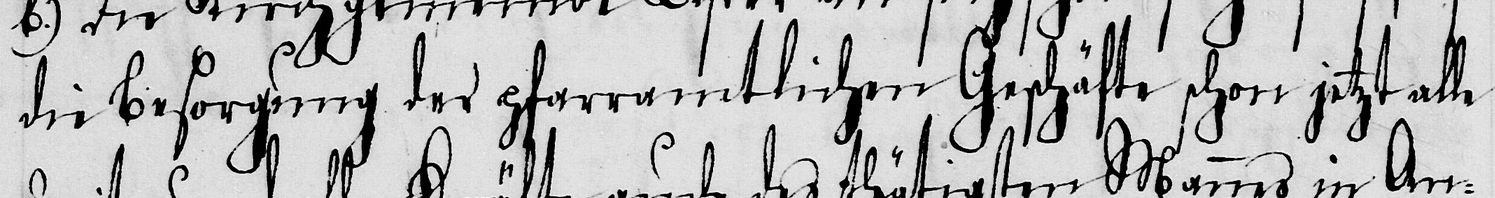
die Besorgung der pfarramtlichen Geschäfte schon jetzt al¬
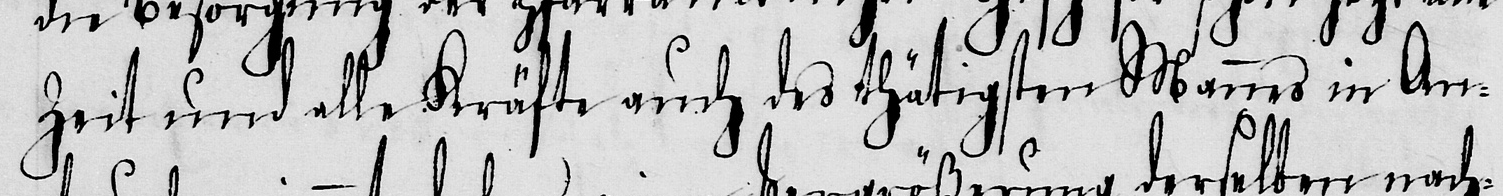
Zeit und alle Kräfte auch des thätigsten Mannes in An¬
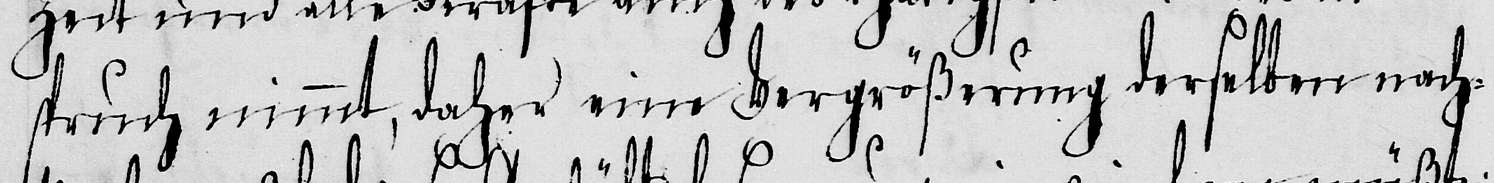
spruch nimmt, daher eine Vergrößerung derselben nach¬
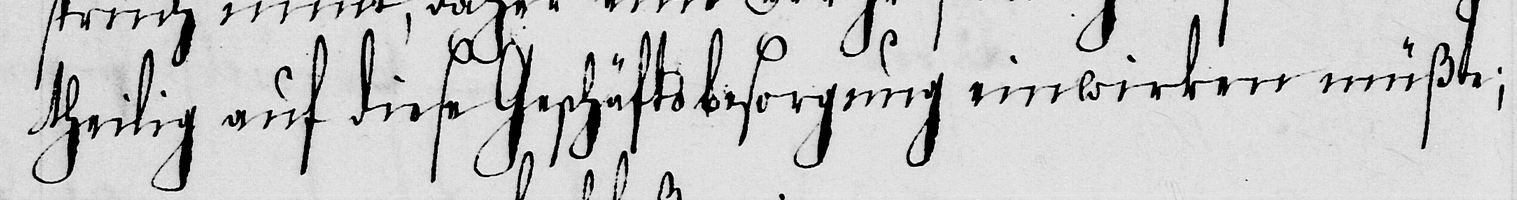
theilig auf diese Geschäftsbesorgung einwirken müßte;
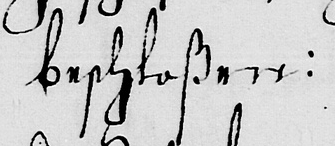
beschloßen:
